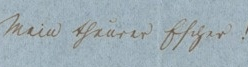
Mein theurer Escher!
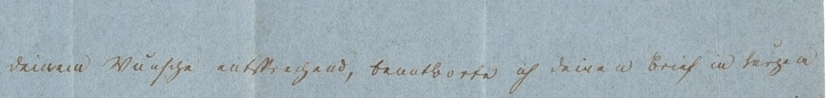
Deinem Wunsche entsprechend, beantworte ich deinen Brief in kurzem
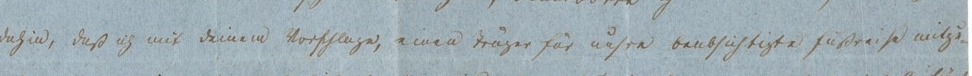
dahin, daß ich mit deinem Vorschlage, einen Träger für unsre beabsichtigte Fußreise mitzu-
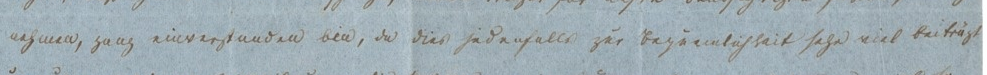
nehmen, ganz einverstanden bin, da dies jedenfalls zur Bequemlichkeit sehr viel beiträgt
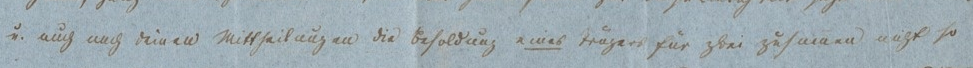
u. auch nach deinen Mittheilungen die Besoldung eines Trägers für zwei zusammen nicht so
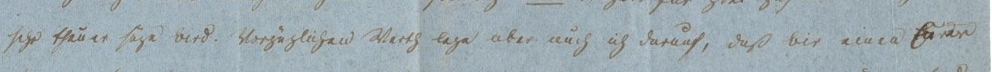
sehr theuer seyn wird. Vorzüglichen Werth lege aber auch ich darauf, daß wir einen Eurer
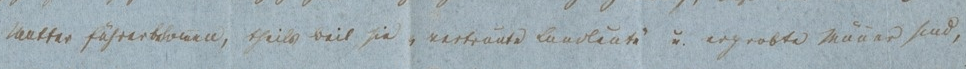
Matter Führer bekommen, theils weil sie «vertraute Landleute» u. erprobte Männer sind,
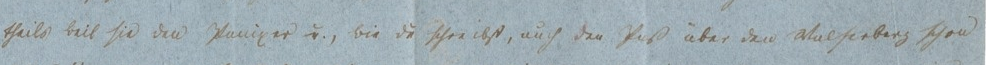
theils weil sie den Panixer u., wie du schreibst, auch den Paß über den Walserberg schon
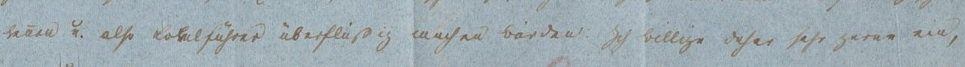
kennen u. also Lokalführer überflüssig machen würden. Ich willige daher sehr gerne ein,
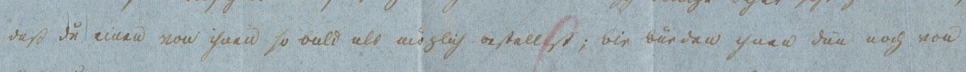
daß du einen von ihnen so bald als möglich bestellest; wir würden ihnen dann noch von
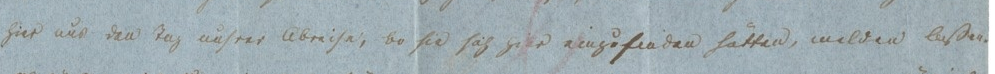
hier aus den Tag unsrer Abreise, wo sie sich hier einzufinden hätten, melden lassen.
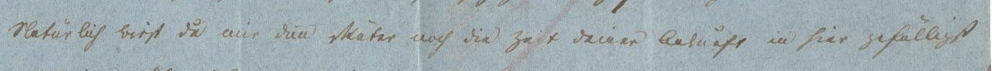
Natürlich wirst du mir dann später noch die Zeit deiner Ankunft in hier gefälligst
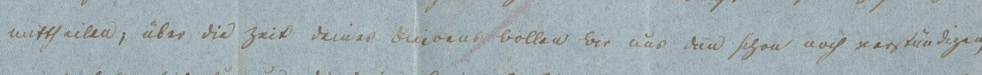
mittheilen; über die Zeit deines Bleibens wollen wir uns dann schon noch verständigen,
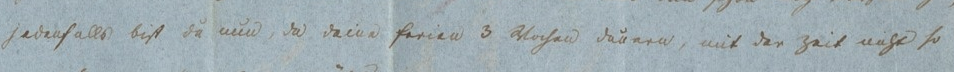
jedenfalls bist du nun, da deine Ferien 3 Wochen dauern, mit der Zeit nicht so
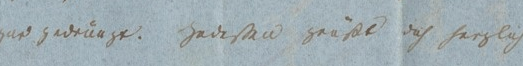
gar gedrängt. Indessen grüßt dich herzlich
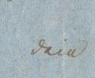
dein
